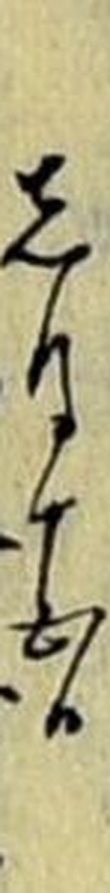十一月十五日
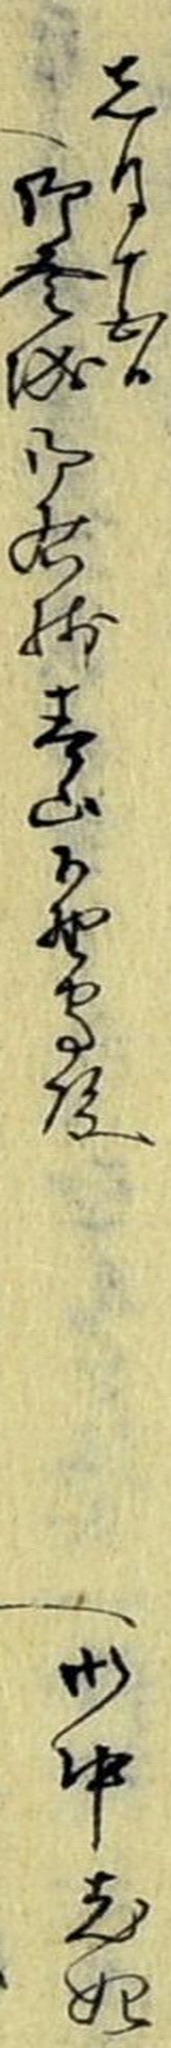御登城御居残青山下野守殿御中老始

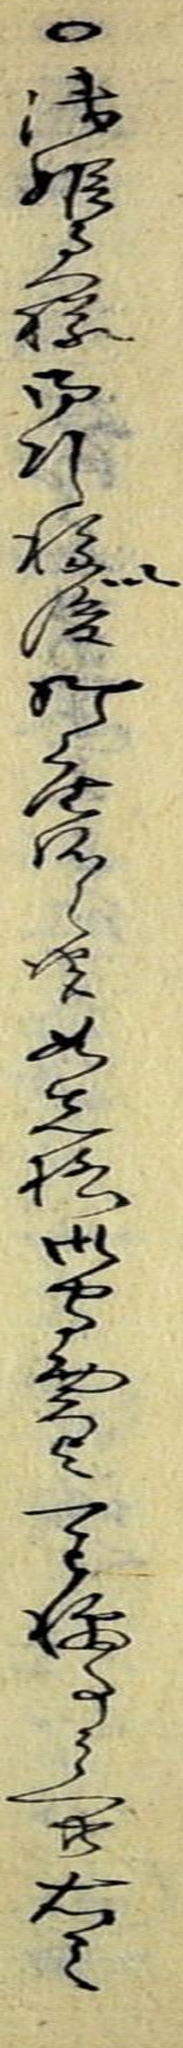○淺姫君様御引移以後御座所之儀如先格御守殿と可被称事に候へ共右之
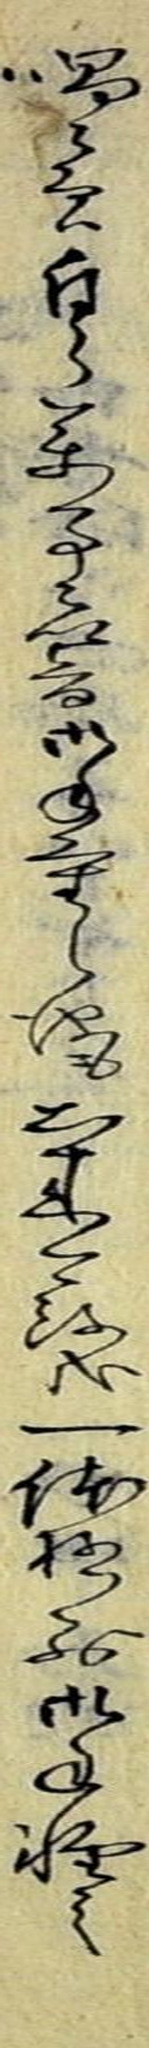唱に而は自ら萬事に響御手重之儀も出来可致哉一体格別御事軽之
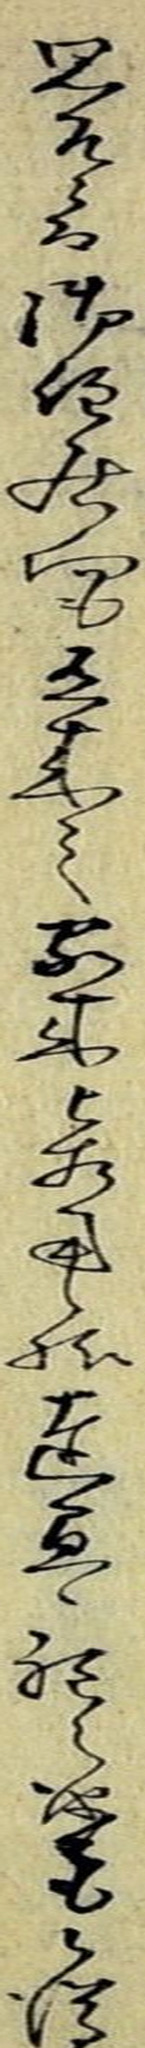思召に而御住居向も有来にて家来被相用候様達置候程之儀に候得は
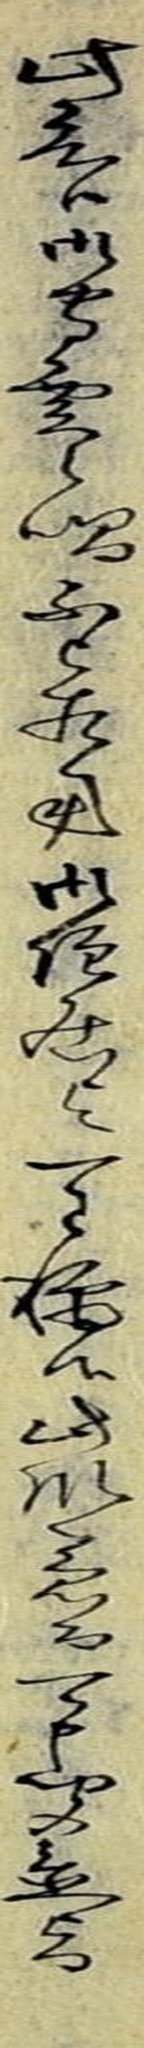此度は御守殿之唱不被相用御住居と可被称候此段兼而可申聞置旨
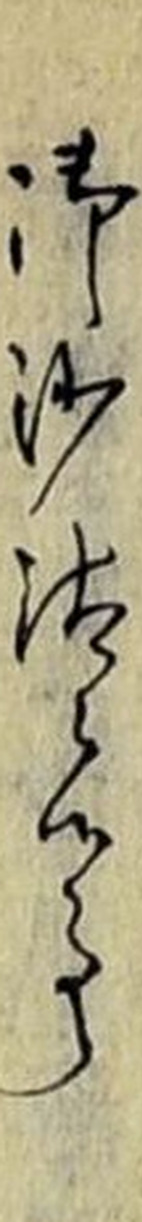御沙汰に候事
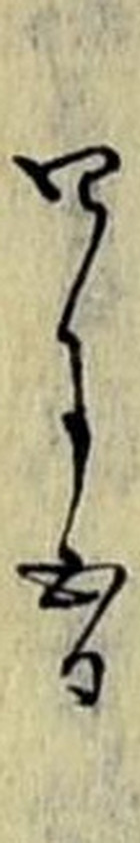四月五日
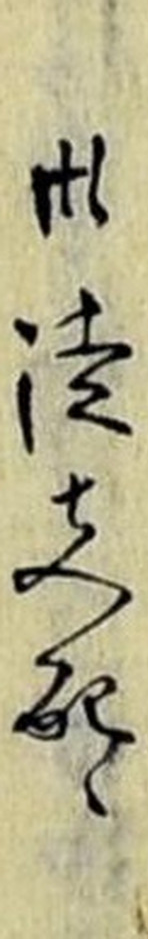御徒支配へ
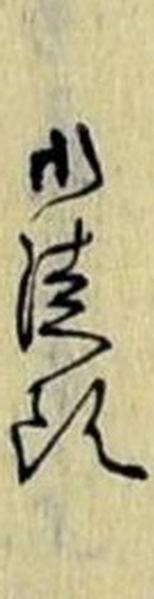御徒頭
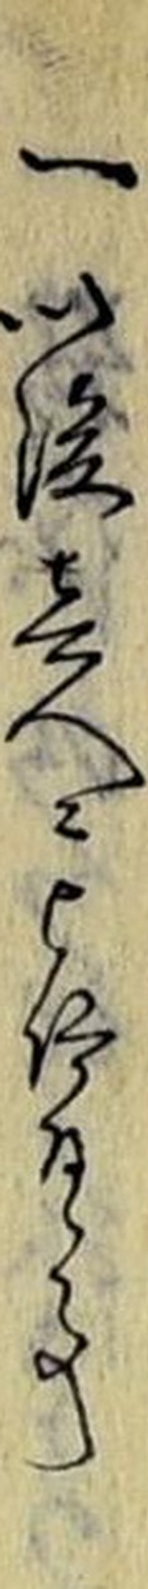一以後壱人に被仰付候事
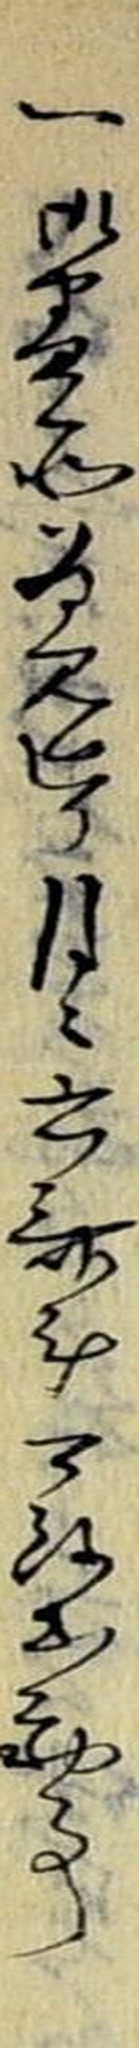一御番所為見廻り月に六刻斗可致出勤事
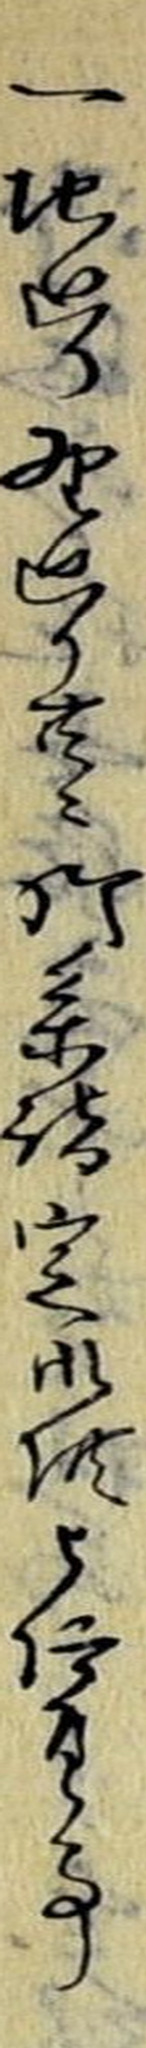一地廻り野廻り共に御参詣定御供被仰付候事
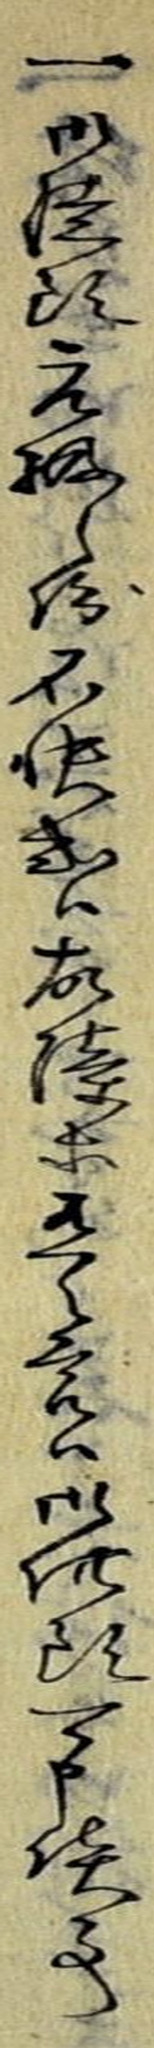一御徒頭取扱之儀不快或は故障等有之節は御供頭可申談事
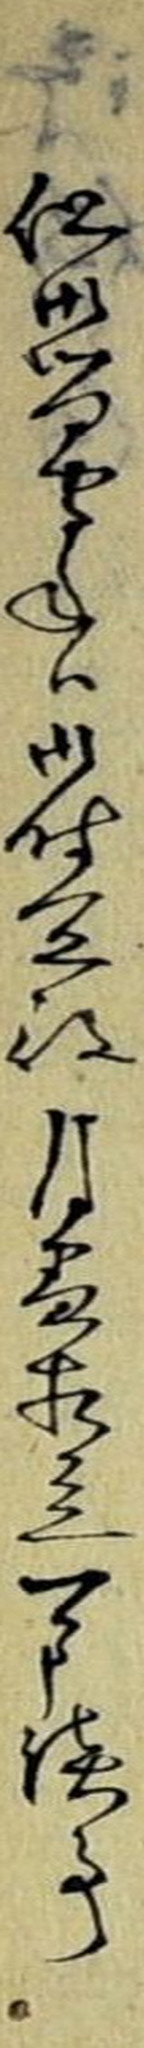但御留守年は御時宜役月番相立可申談候事
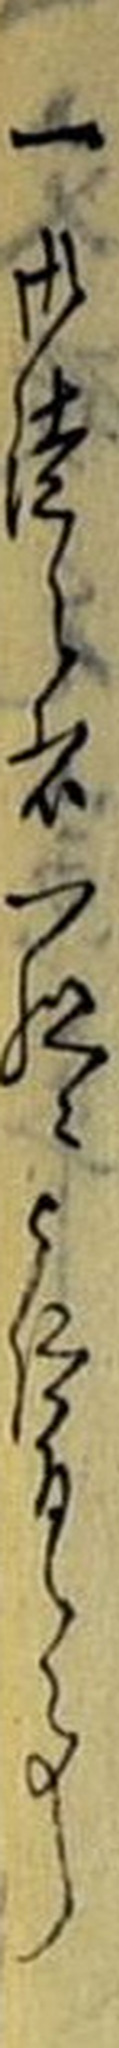一御徒之者一組に被仰付候事
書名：命令之部 四
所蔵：福井県文書館 Fukui Prefectural Archives
